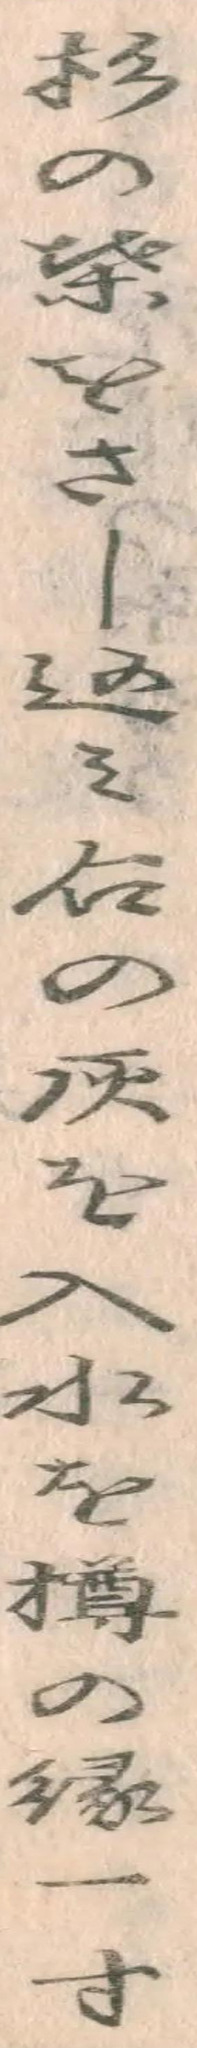杉の葉をさし込み右の灰を入水を樽の縁一寸
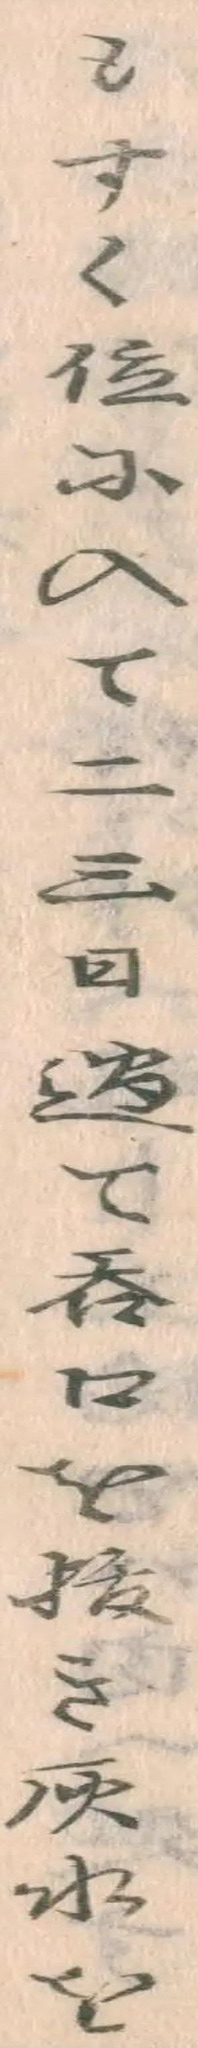もすく位に入て二三日過て吞口を抜き灰水を
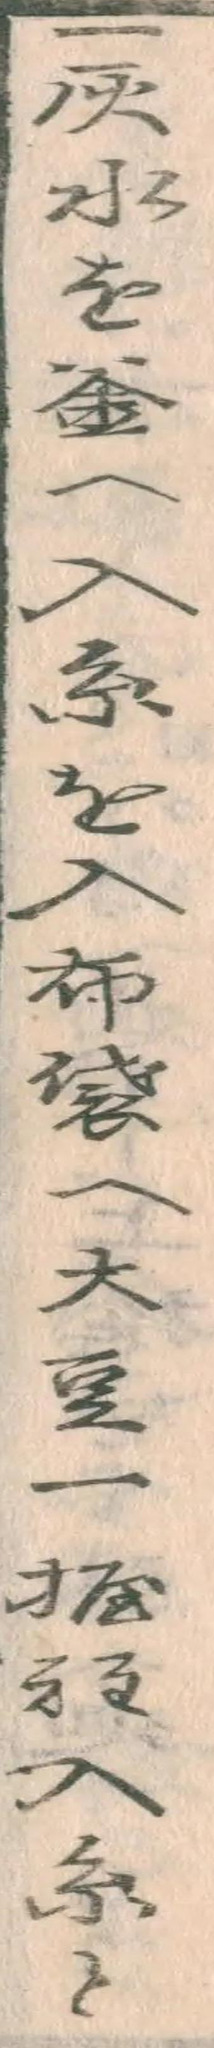一灰水を釜へ入糸を入布袋へ大豆一握程入糸と
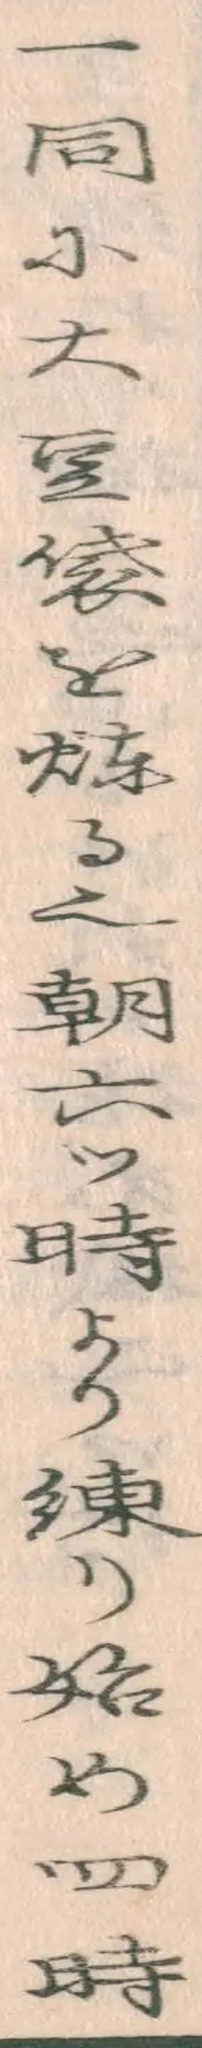一同に大豆袋を煉る也朝六ッ時より練り初め四時
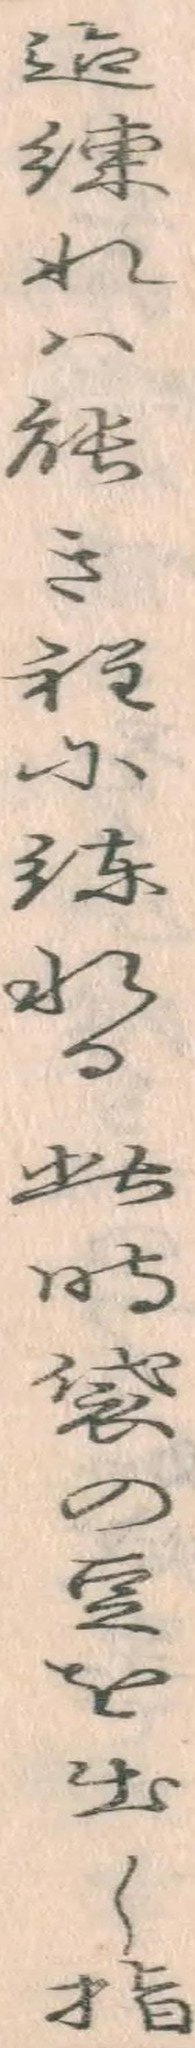迄練れは能き程に練れる此時袋の豆を出し指
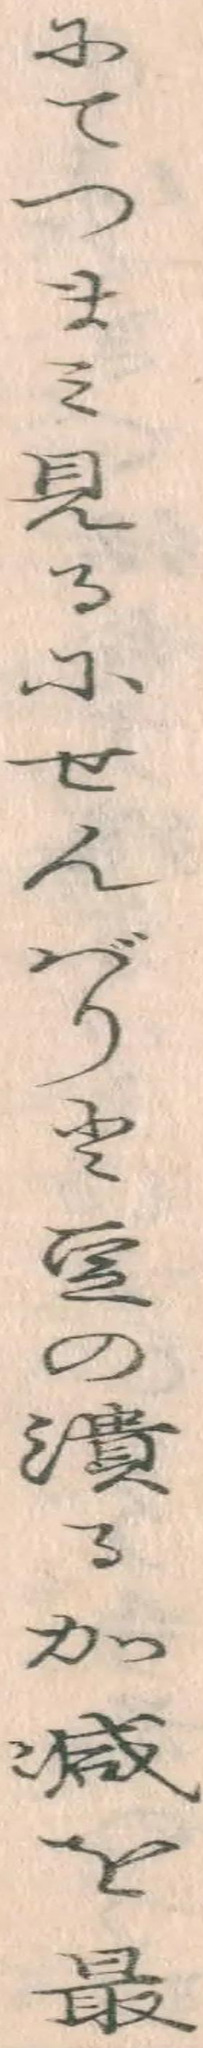にてつまみ見るにせんばりと豆の潰る加減を最
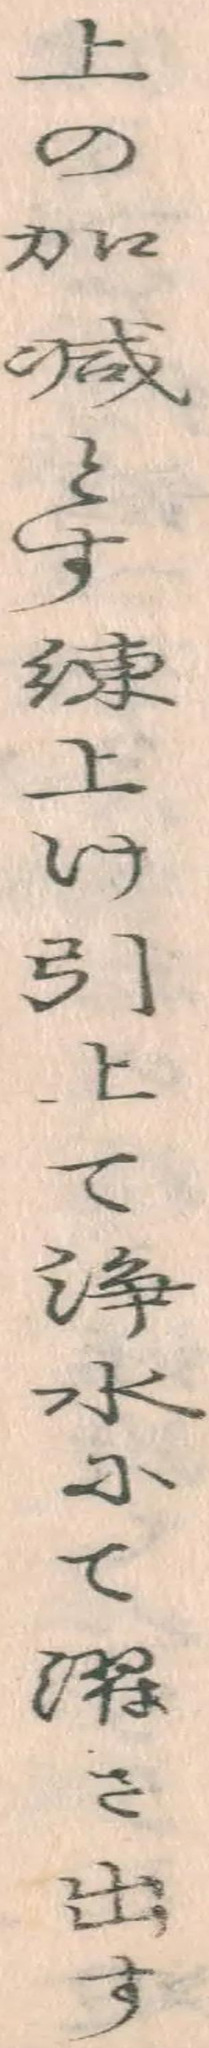上の加減とす練上け引上て浄水にて濯き出す
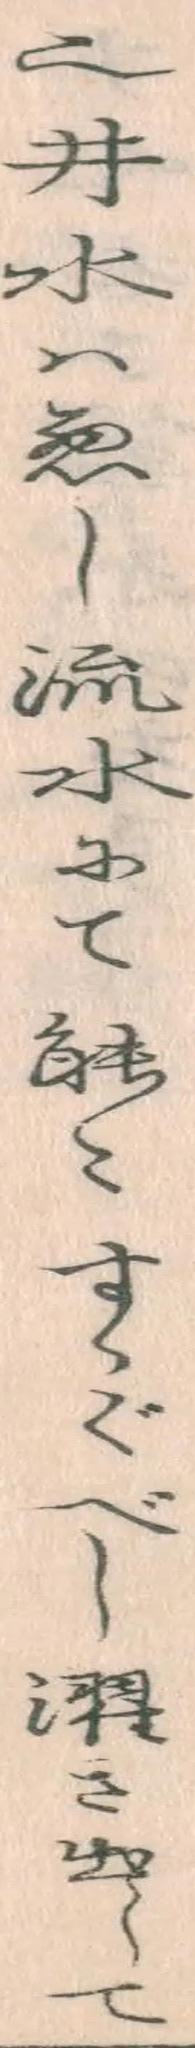也井水は悪し流水にて能々すゝぐべし濯き出して
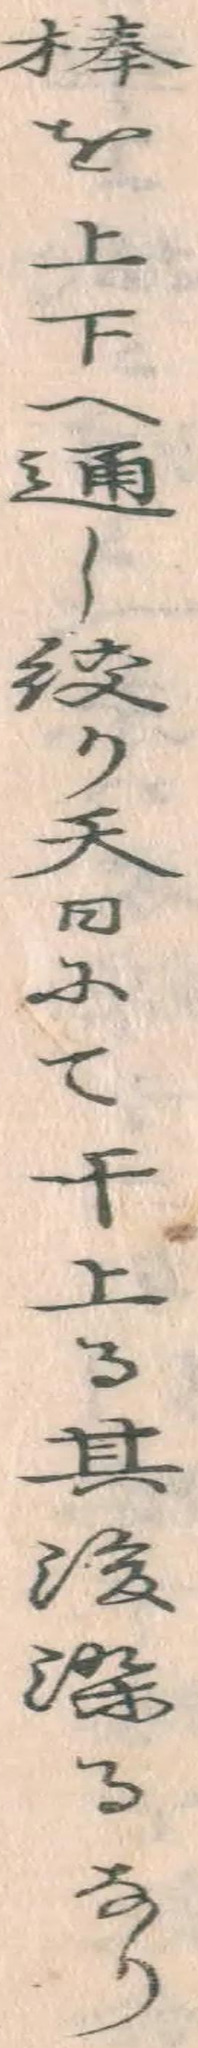棒を上下へ通し絞り天日にて干上る其後染るなり
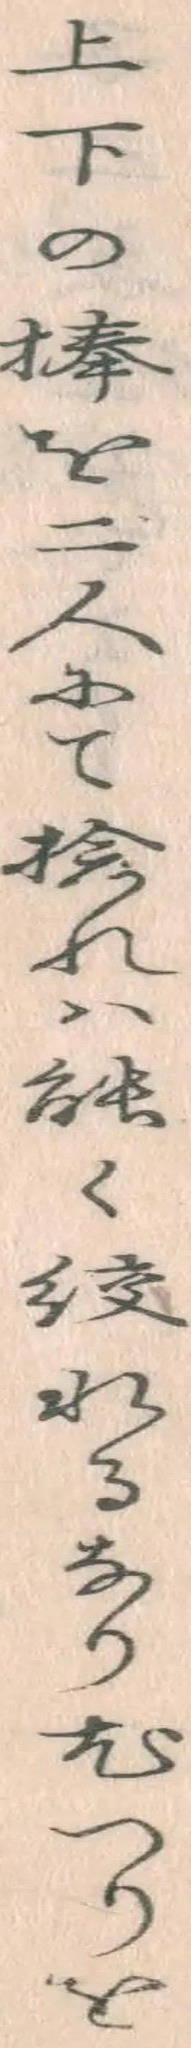上下の棒を二人にて捻れは能く絞れるなり尤つりを
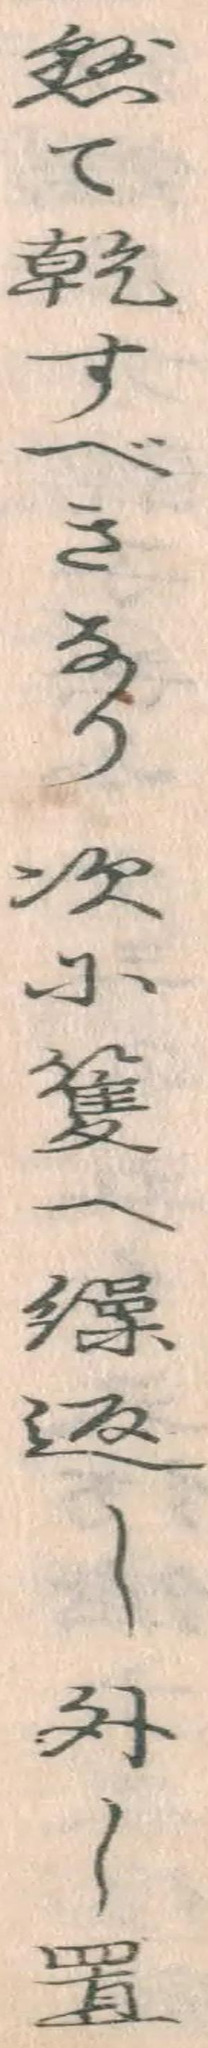懸て乾すべきなり次に篗へ繰返し外し置
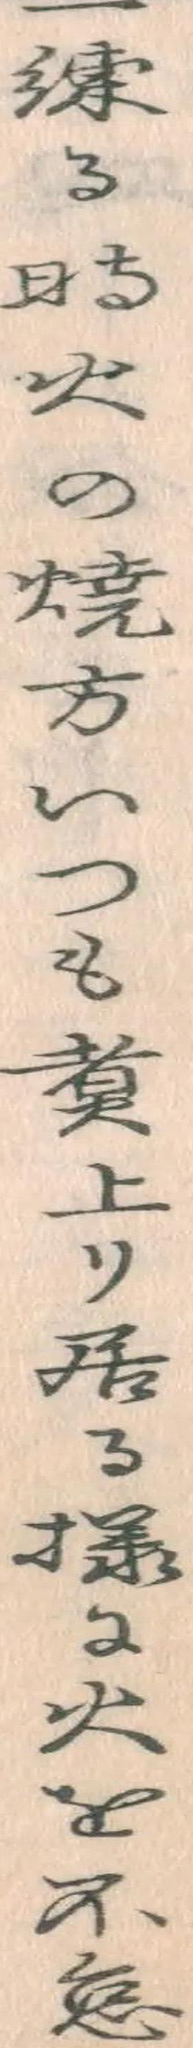一練る時火の焼方いつも煮上り居る様に火を不怠
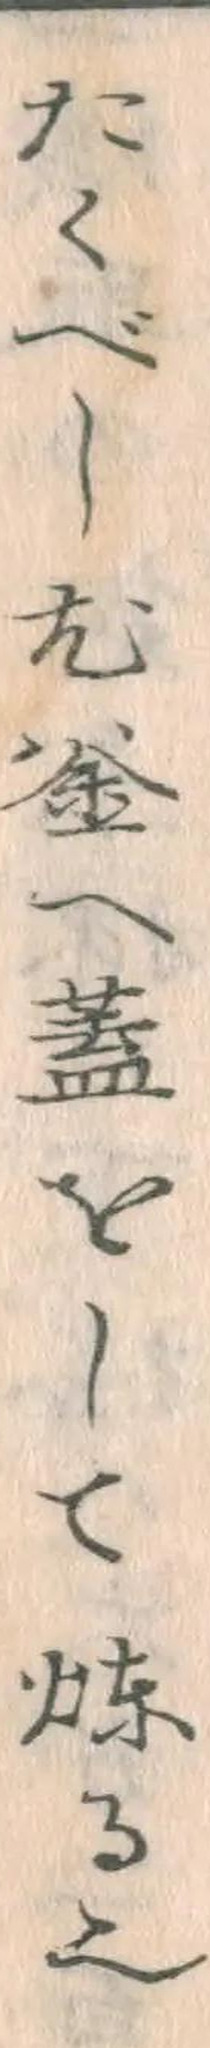たくべし尤釜へ蓋をして煉る也
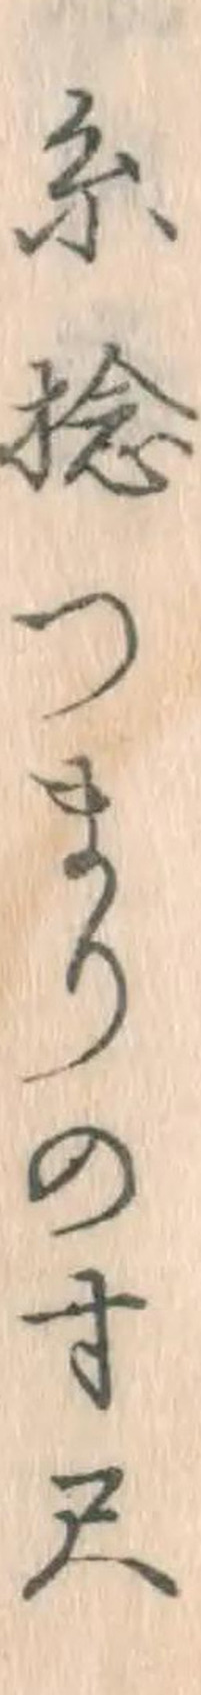糸捻つまりの寸尺
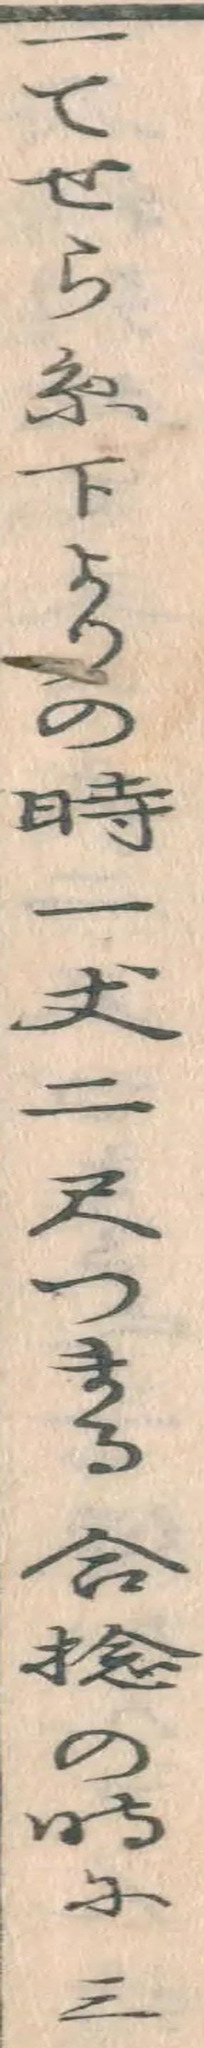一てせら糸下よりの時一丈二尺つまる合捻の時に三

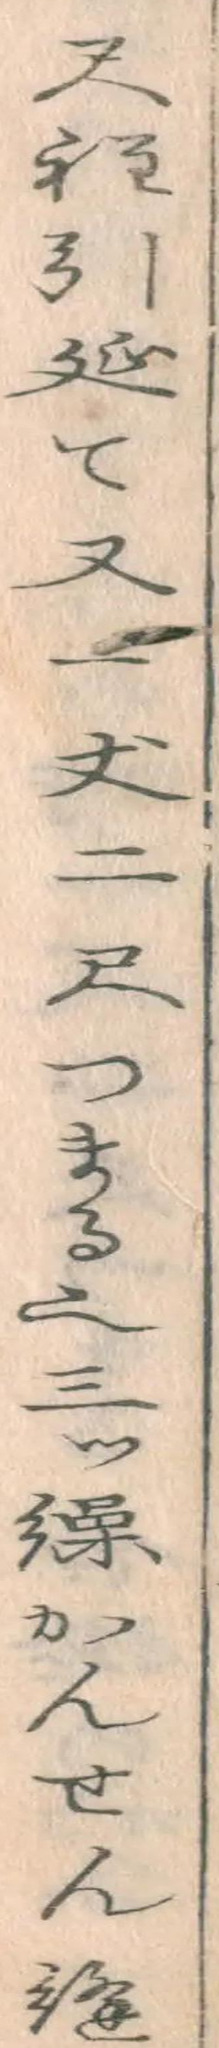尺程引延て又一丈二尺つまる也三ッ繰かんせん縫
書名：機織彙編 5巻. [1]
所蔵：国立国会図書館 National Diet Library, JAPAN
